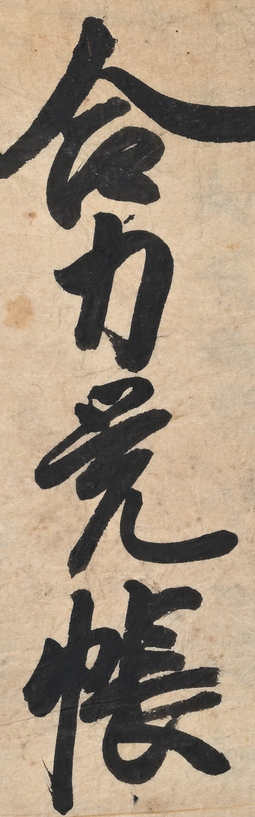合力覚帳
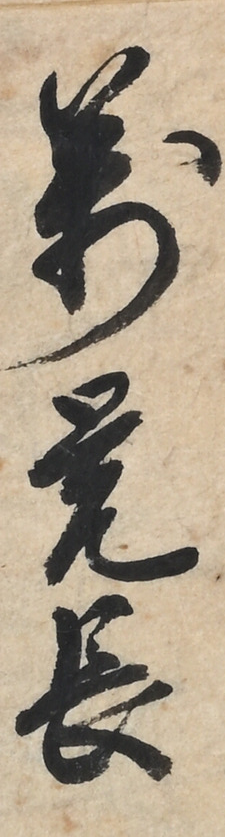萬覚長

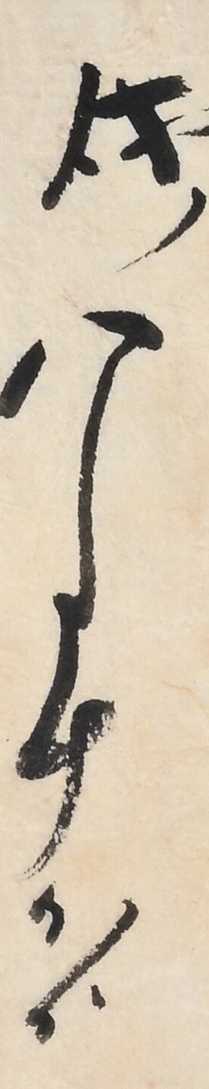戌ノ八月十日ゟ

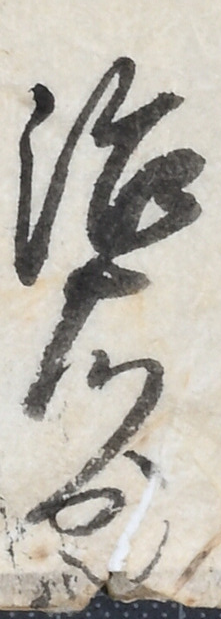惣右衛門
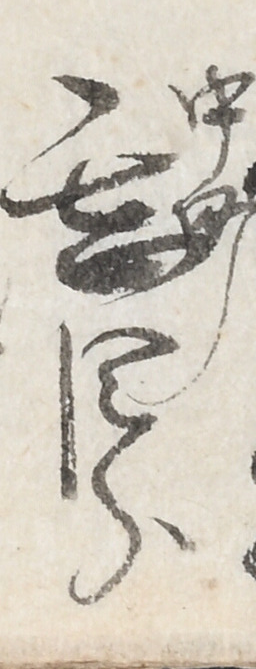甚四郎
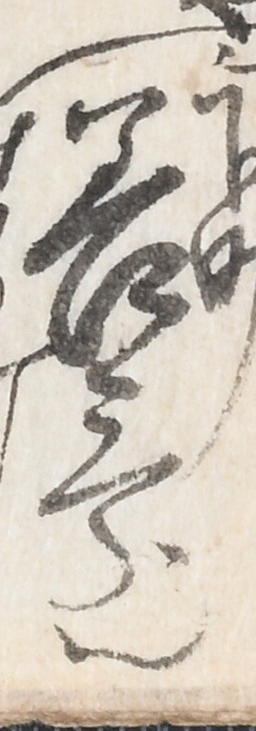善三郎
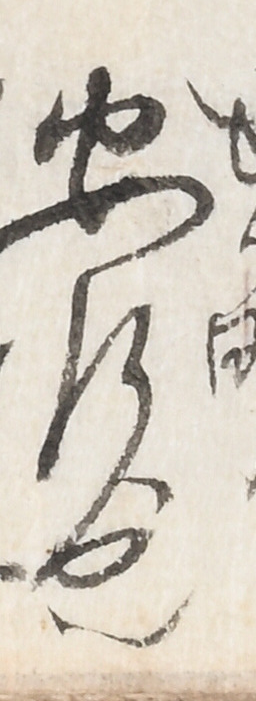安左衛門
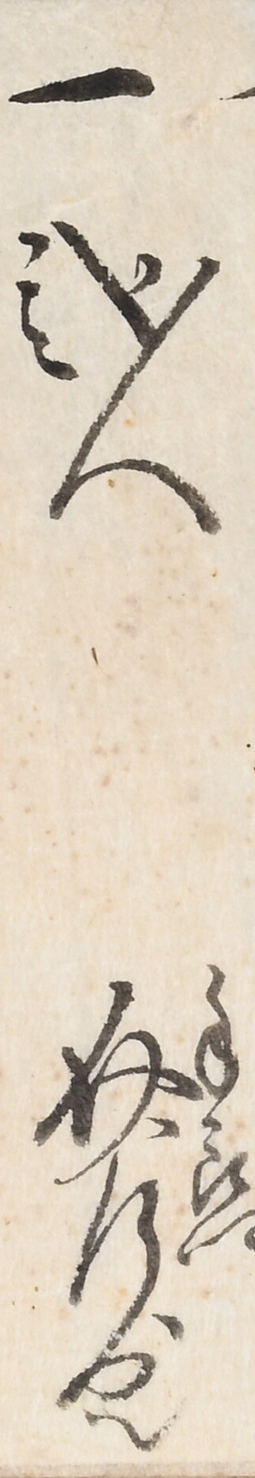一壱人治左衛門
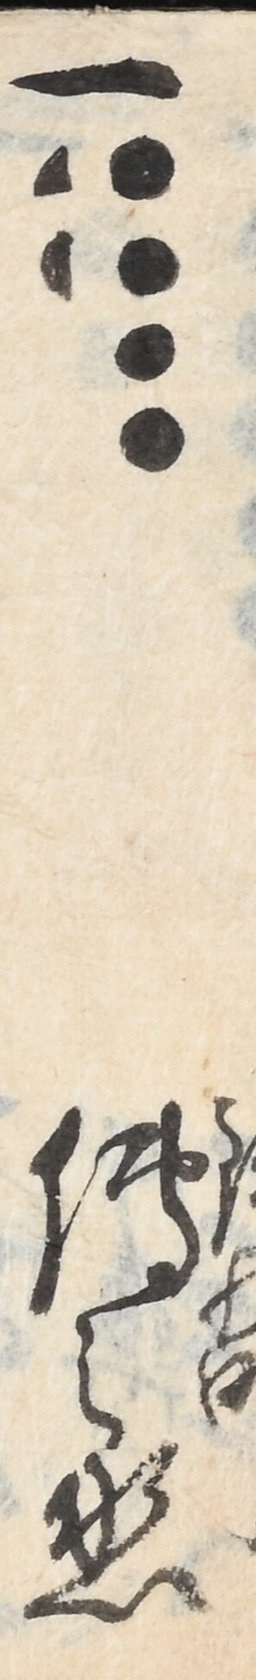一弐人伝之丞
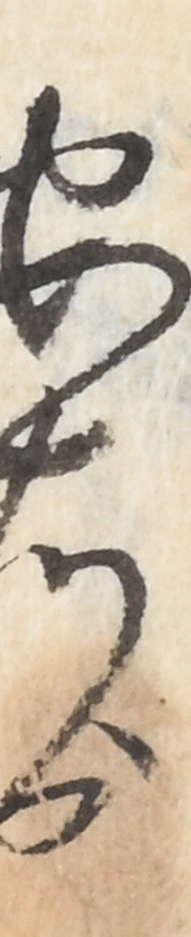惣右衛門

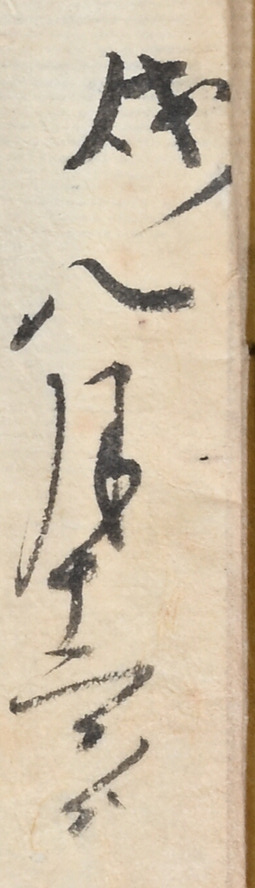戌ノ八月十二日ゟ
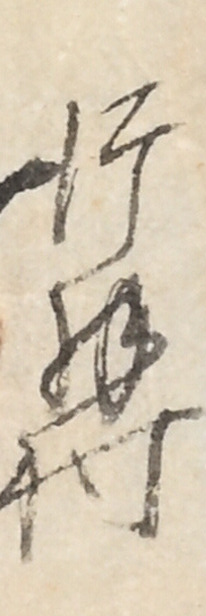片羽村
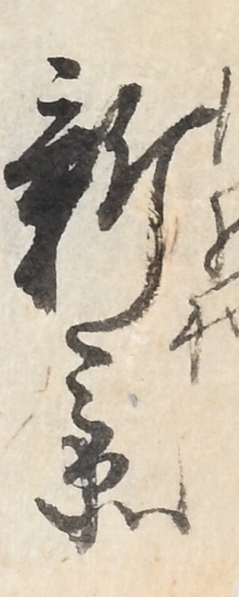新兵衛
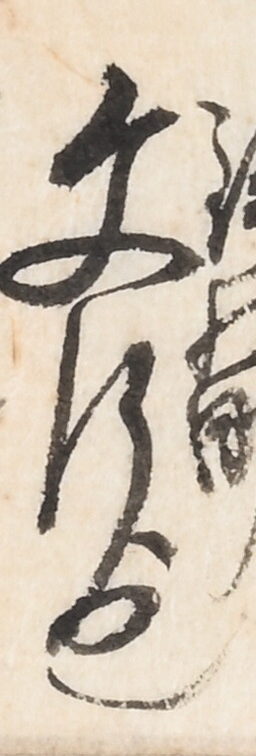安左衛門
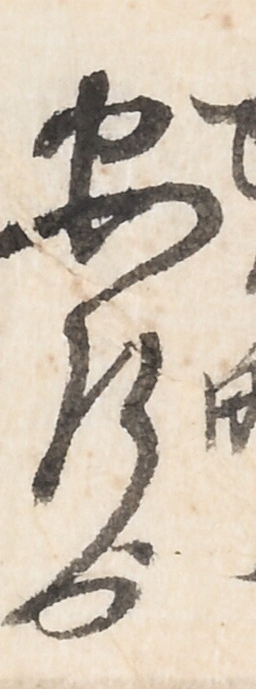安左衛門
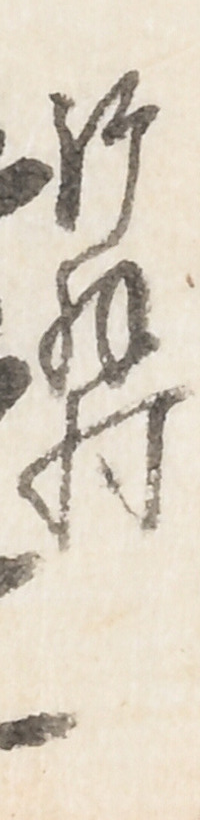片羽村
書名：合力覚帳
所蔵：伊那市立高遠町図書館・合同会社AMANE
